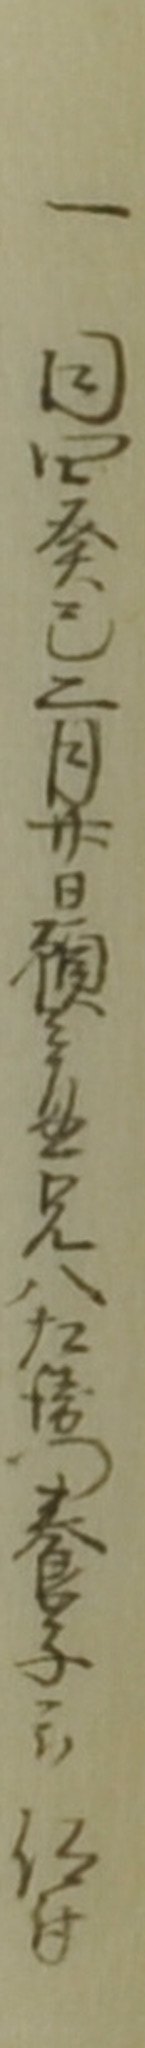一同四癸巳二月廿日願之通八左衛門養子被仰付
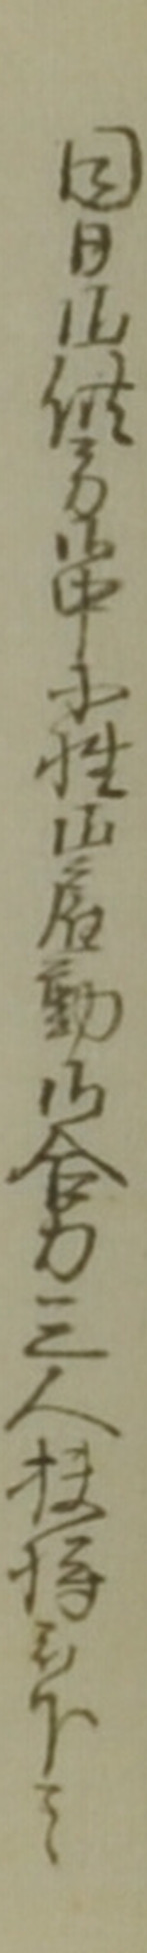同日御供方御中小性御雇勤御合力三人扶持被下之
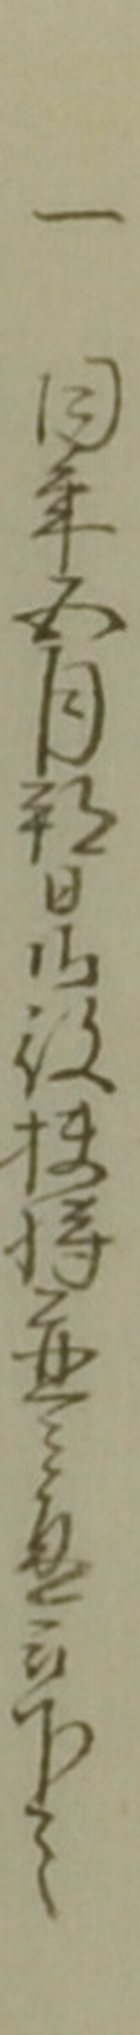一同年五月朔日御役扶持並之通被下之
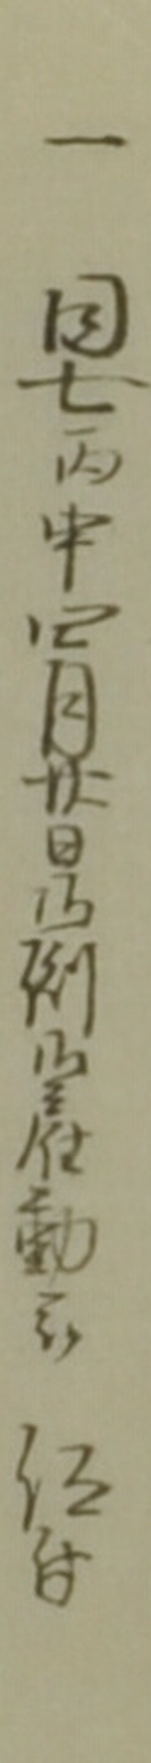一同七丙申四月廿日御側御雇勤被仰付
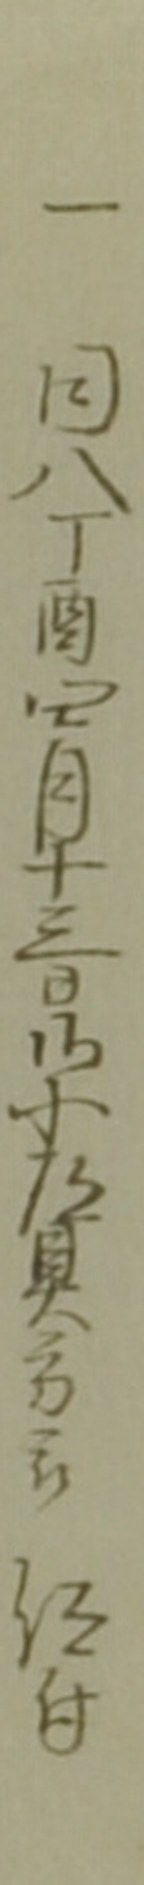一同八丁酉四月十三日御小道具方被仰付
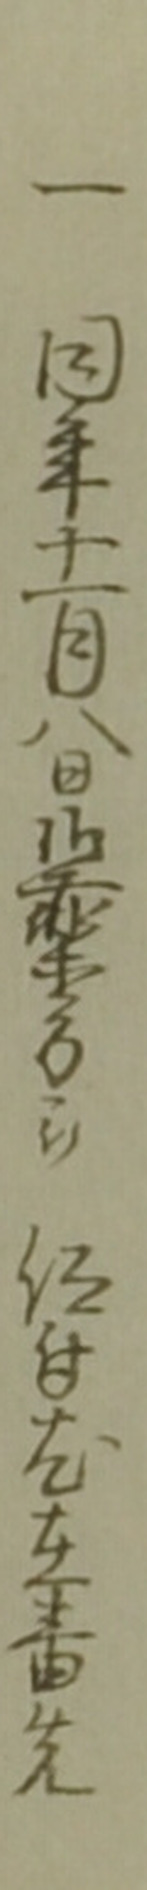一同年十一月八日御薬方被仰付尤在番先
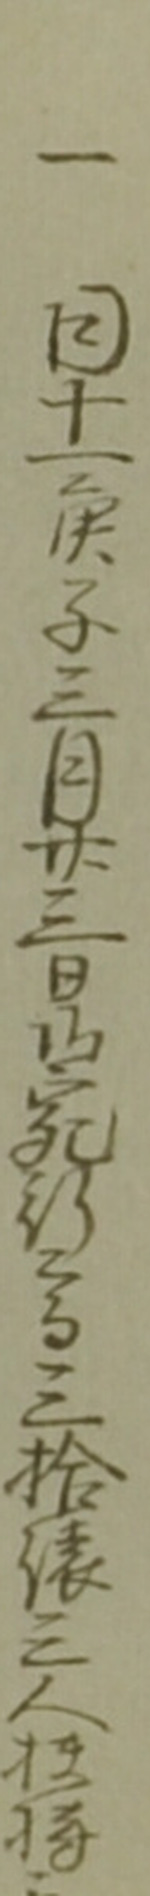一同十一庚子三月廿三日御宛行高三拾俵三人扶持被下

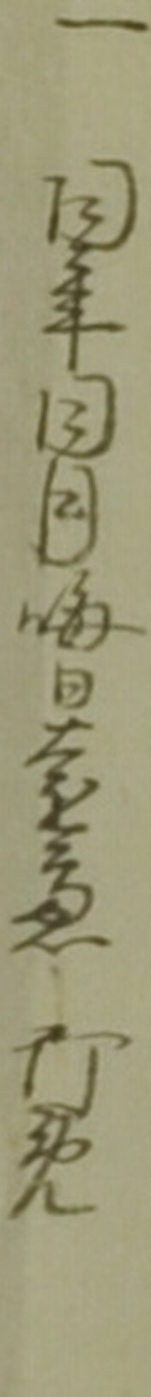一同年同月晦日遠慮御免
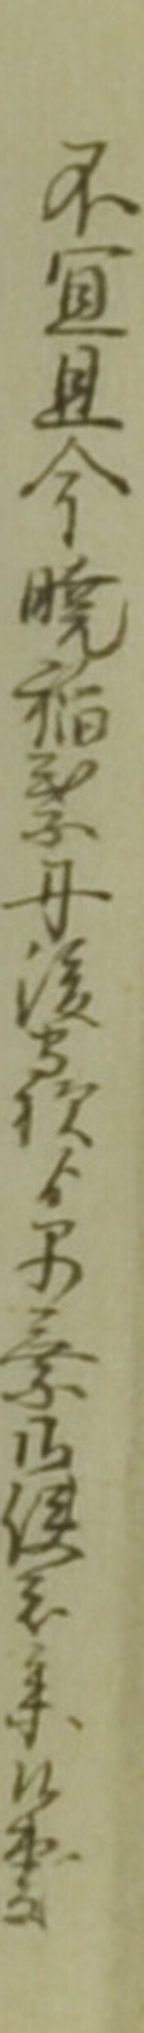不宜且今暁稲葉丹後守様ゟ早乗御使者参候処
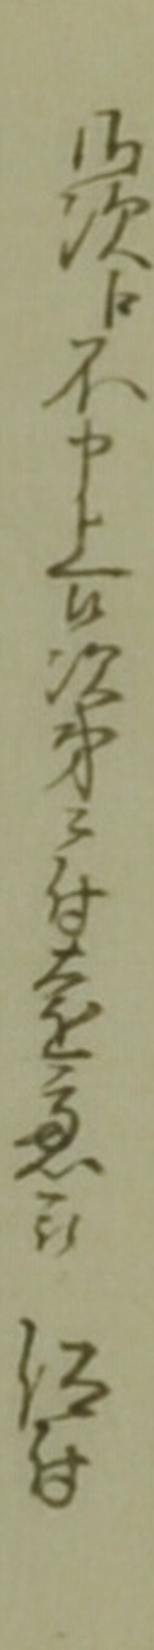御次江不申上候次第ニ付遠慮被仰付
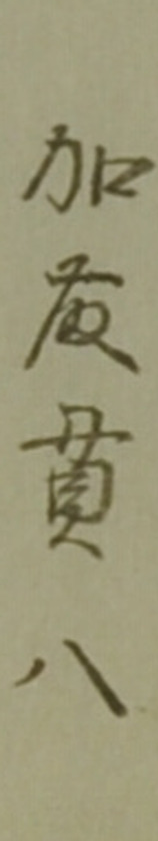加藤貫八
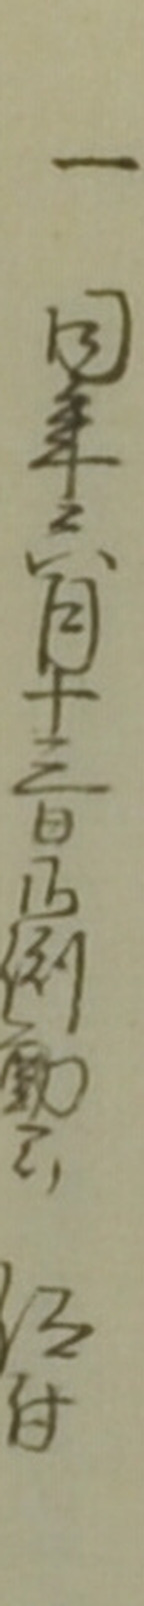一同年六月十三日御側勤被仰付
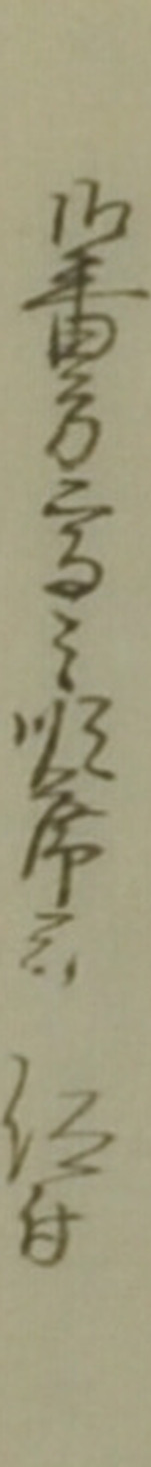御番方高之順席被仰付
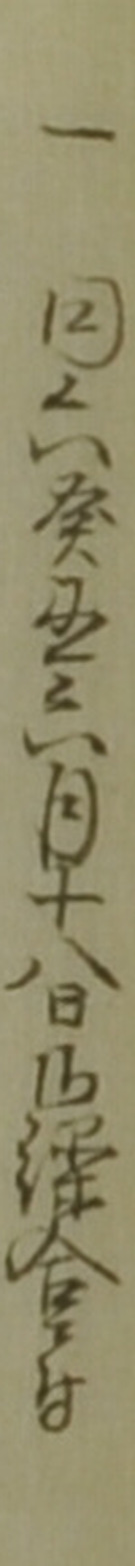一同六癸丑六月十八日御繰合ニ付
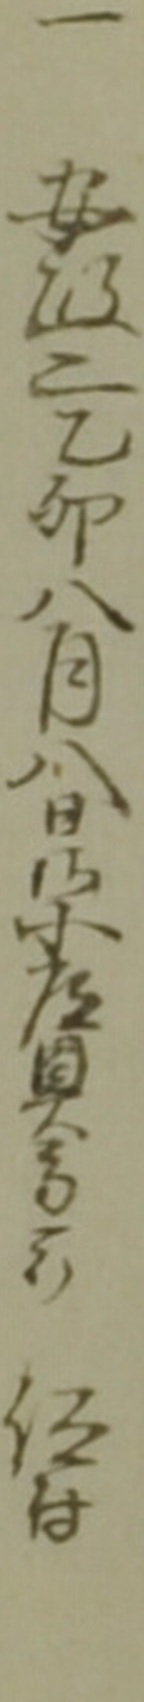一安政二乙卯八月八日御小道具方被仰付
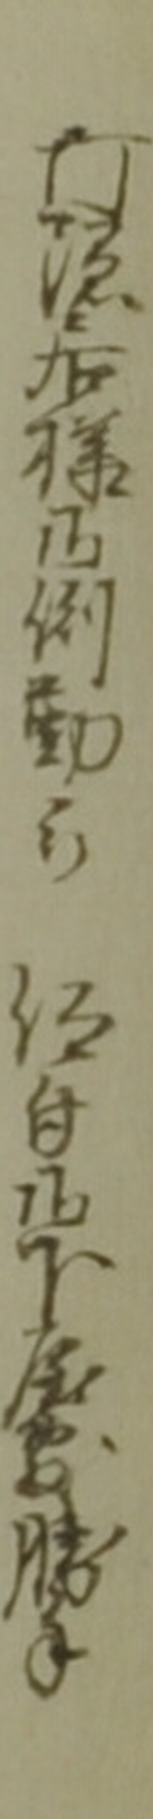御隠居様御側勤被仰付御下屋敷勝手
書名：給人諸士勤仕録（三）
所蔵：伊那市立高遠町図書館・合同会社AMANE
